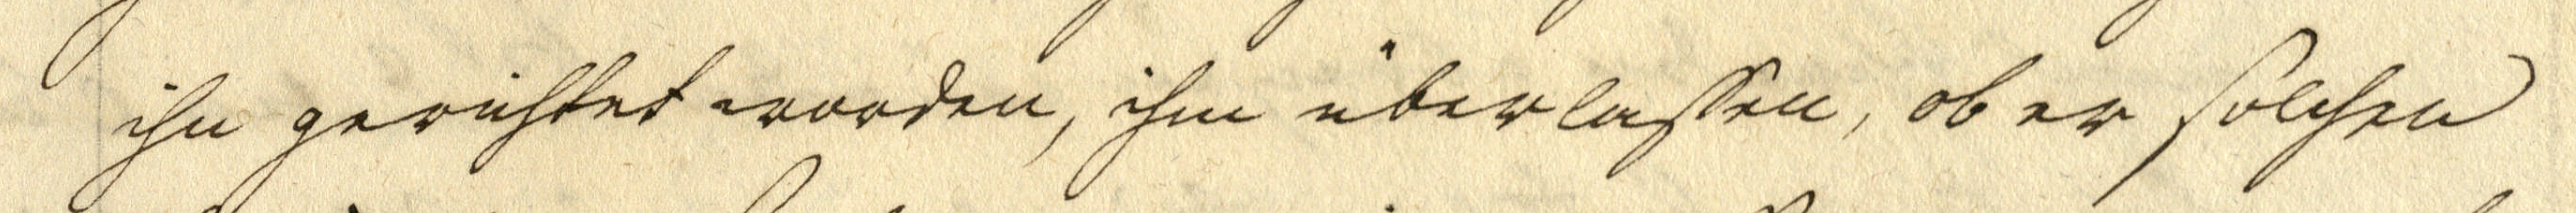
ihn gerichtet worden, ihm überlassen, ob er solchen
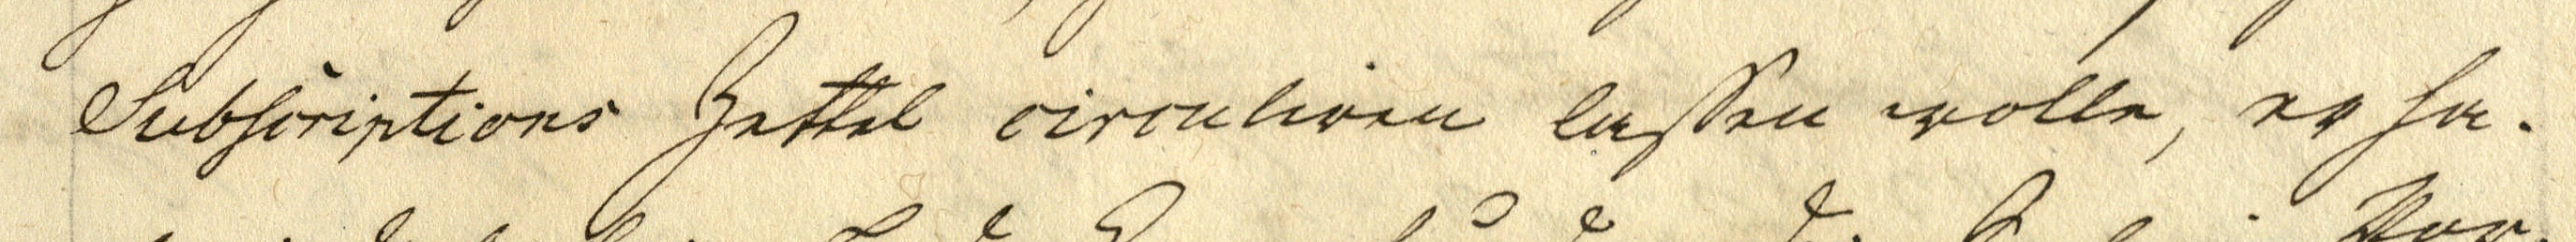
Subscriptions Zettel circuliren lassen wolle, er ha-
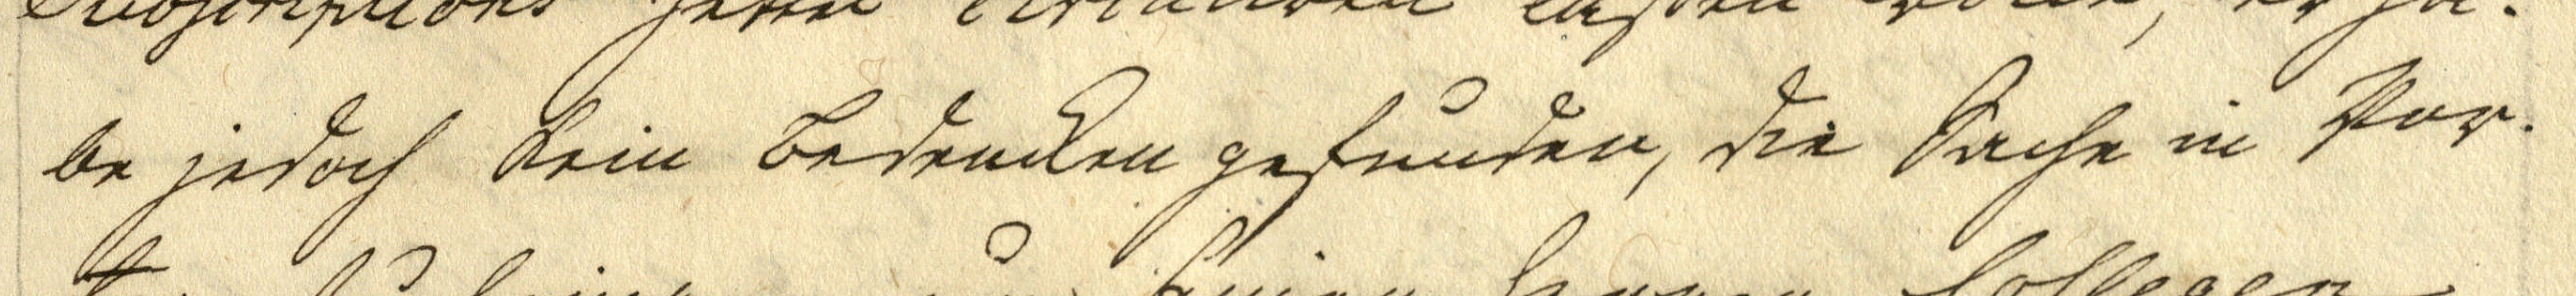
be jedoch kein Bedenken gefunden, die Sache in Vor-
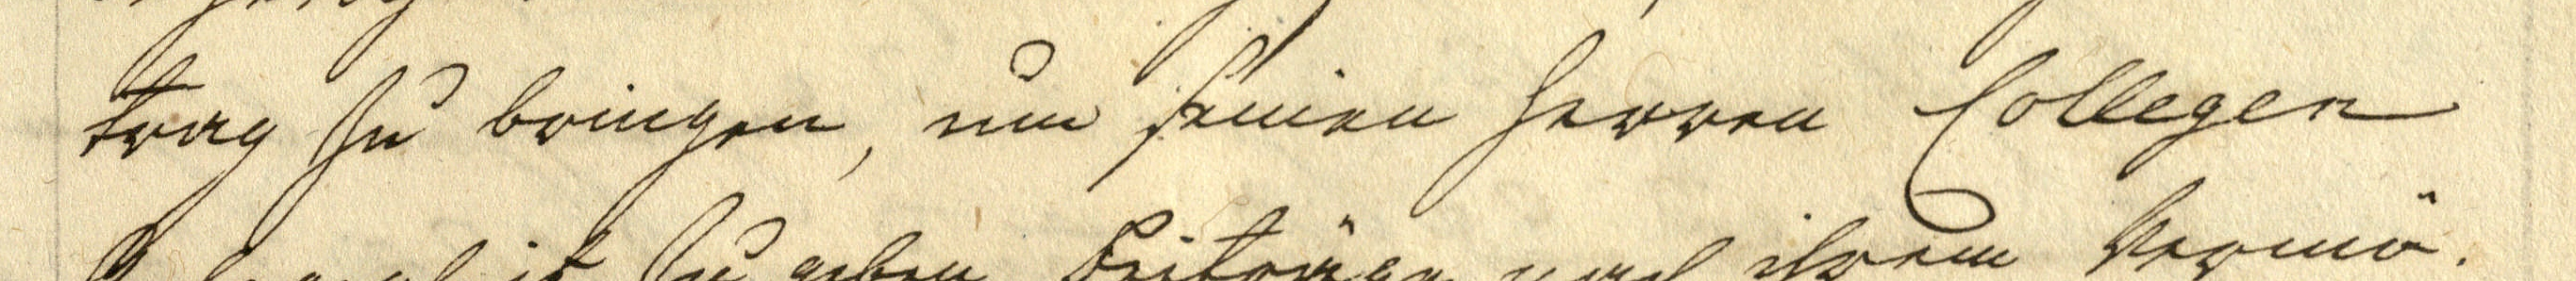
trag zu bringen, um seinen Herren Collegen
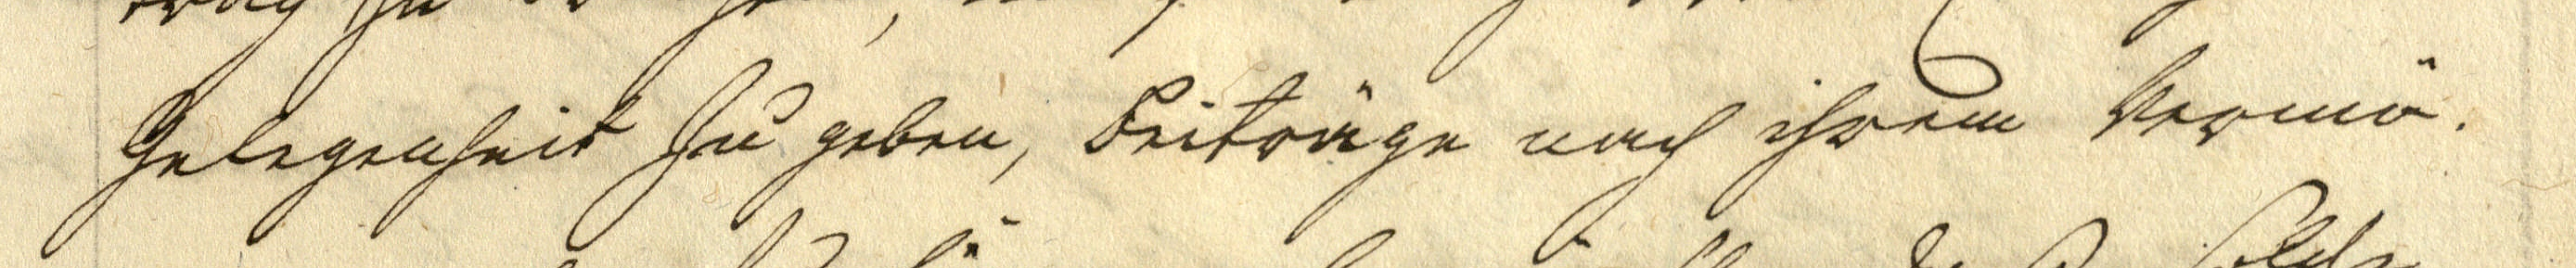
Gelegenheit zu geben, Beiträge nach ihrem Vermö-
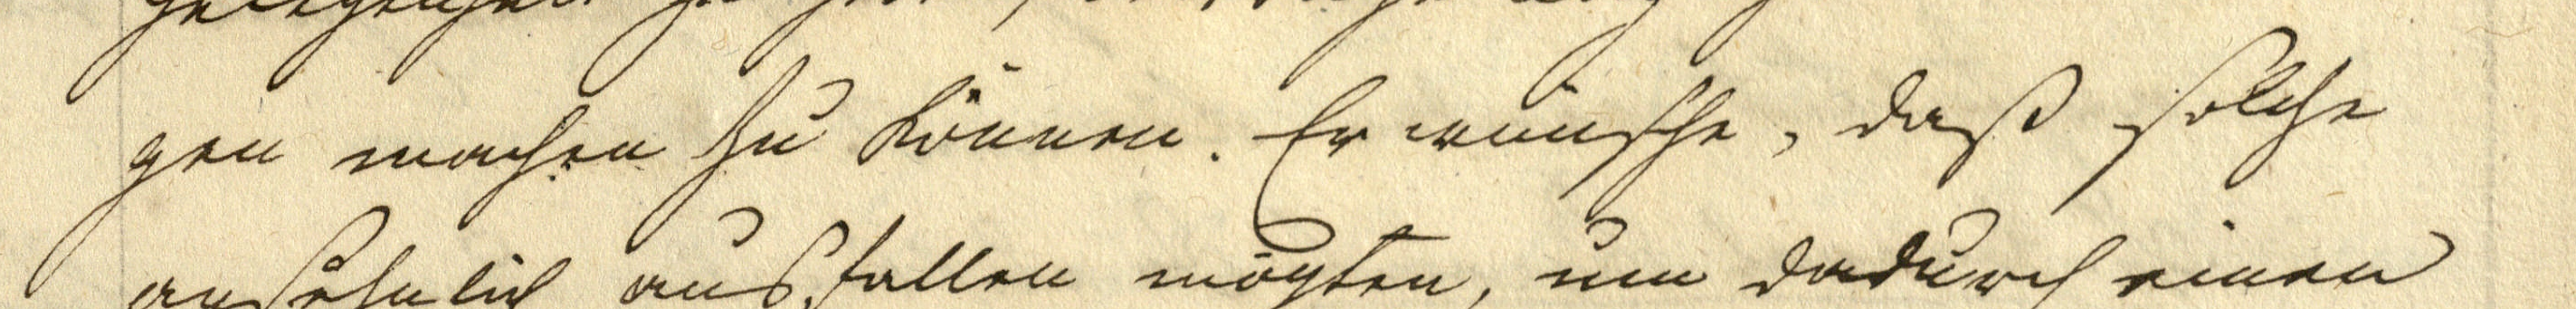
gen machen zu können. Er wünsche, daß solche
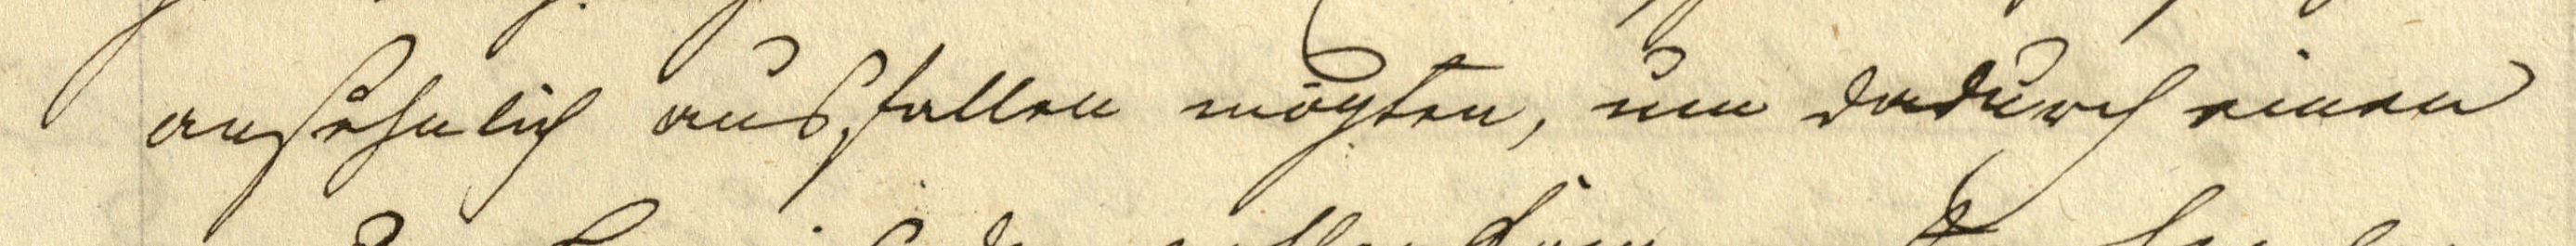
Ansehnlich ausfallen mögten, um dadurch einen
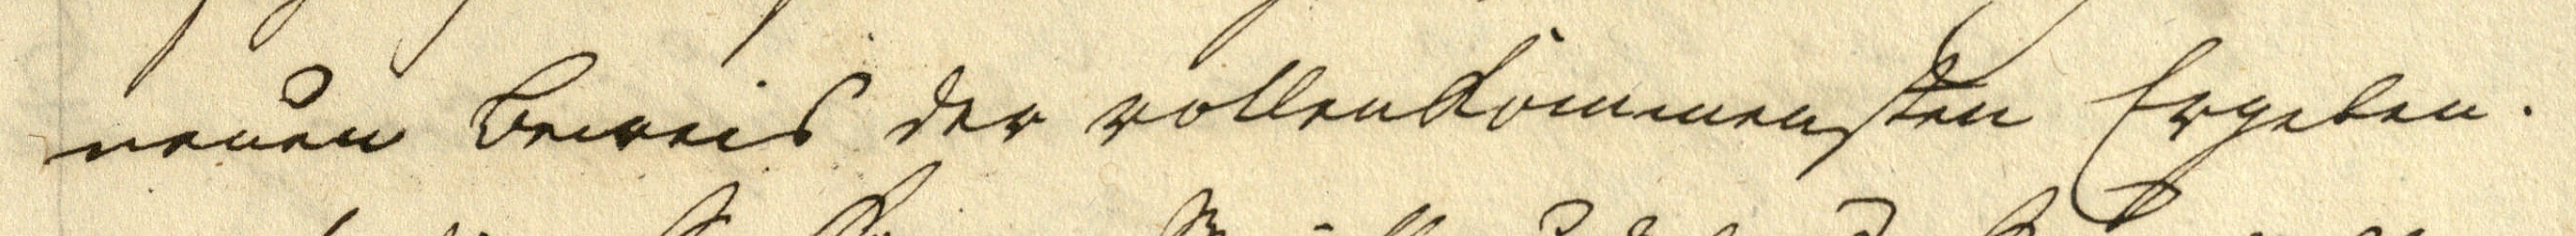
neuen Beweis der vollenkommensten Ergeben-
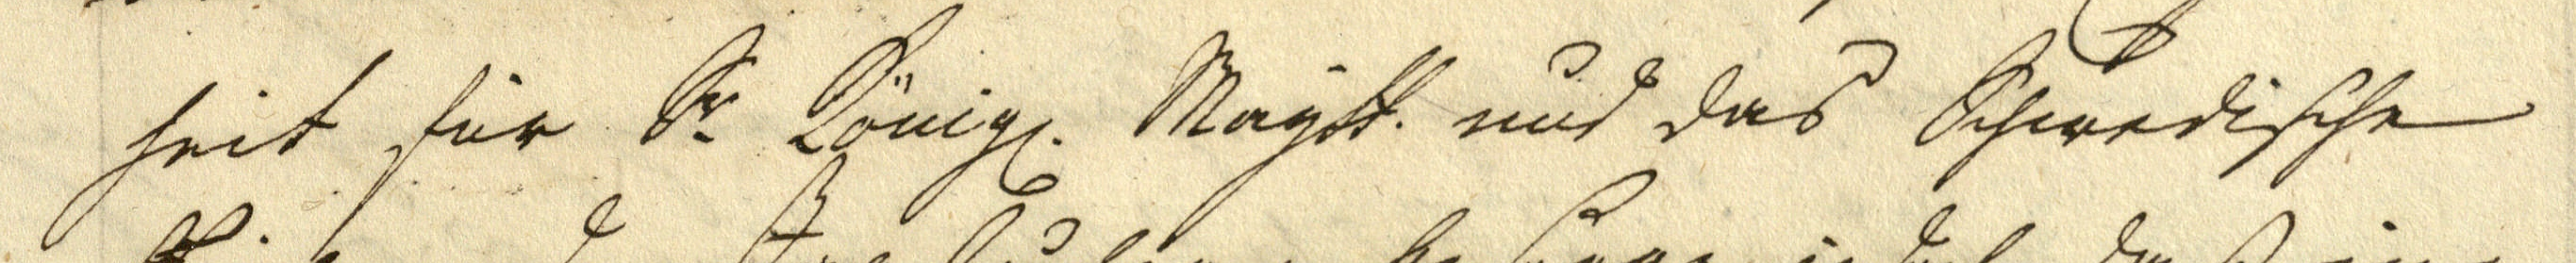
heit für Sr. Königl. Maytt. und das Schwedische
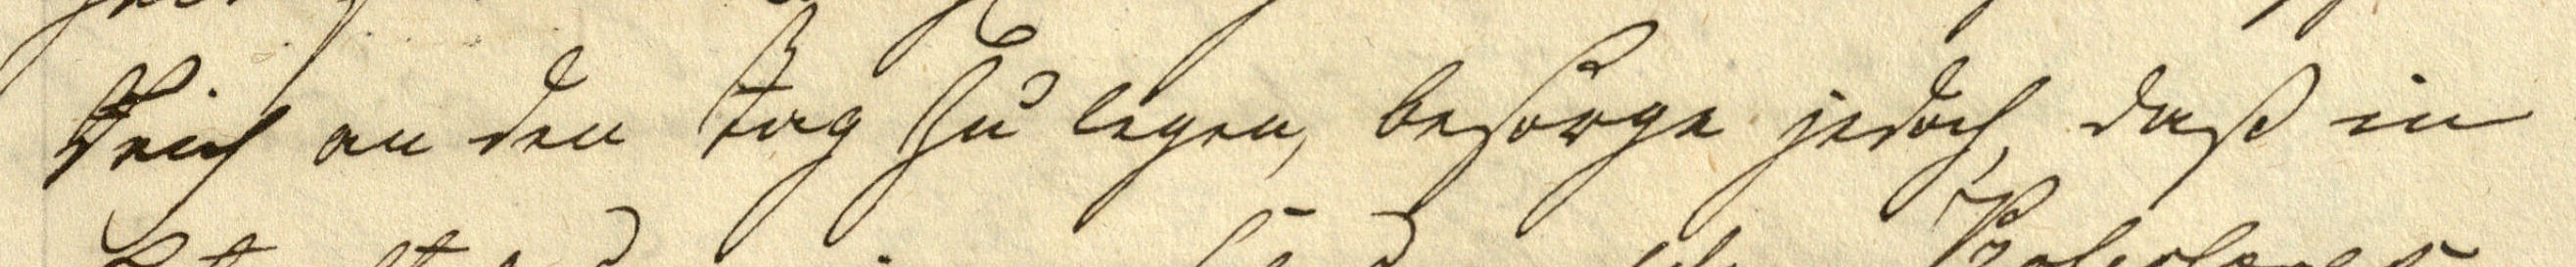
Reich an den Tag zu legen, besorge jedoch, daß in
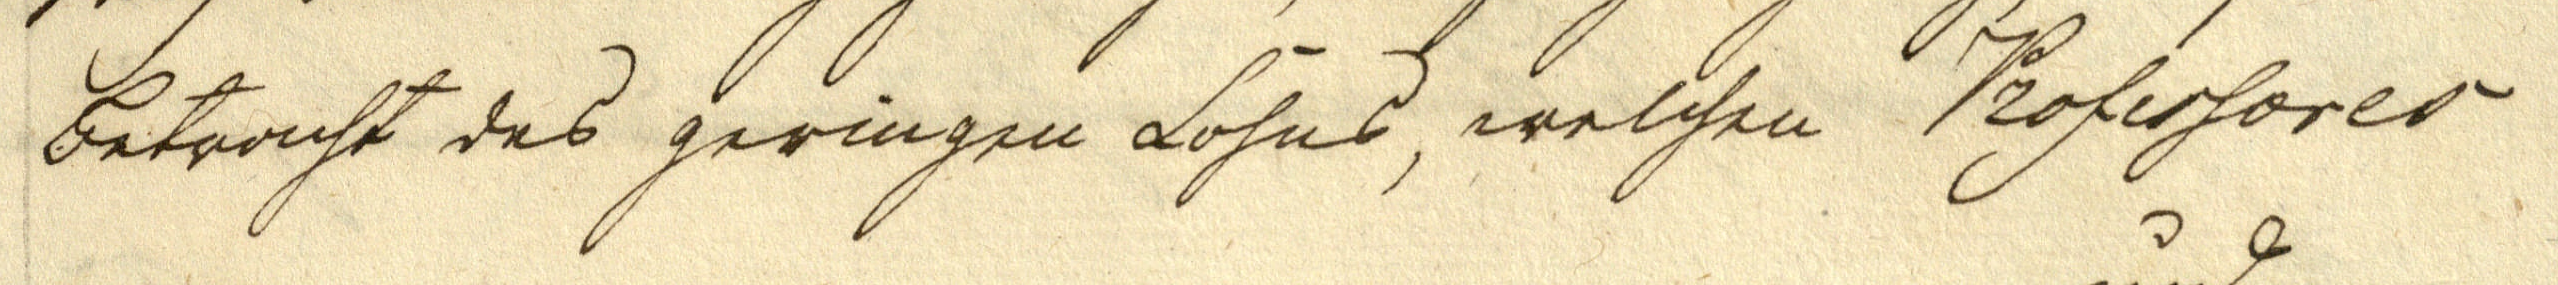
Betracht des geringen Lohns, welchen Professores
